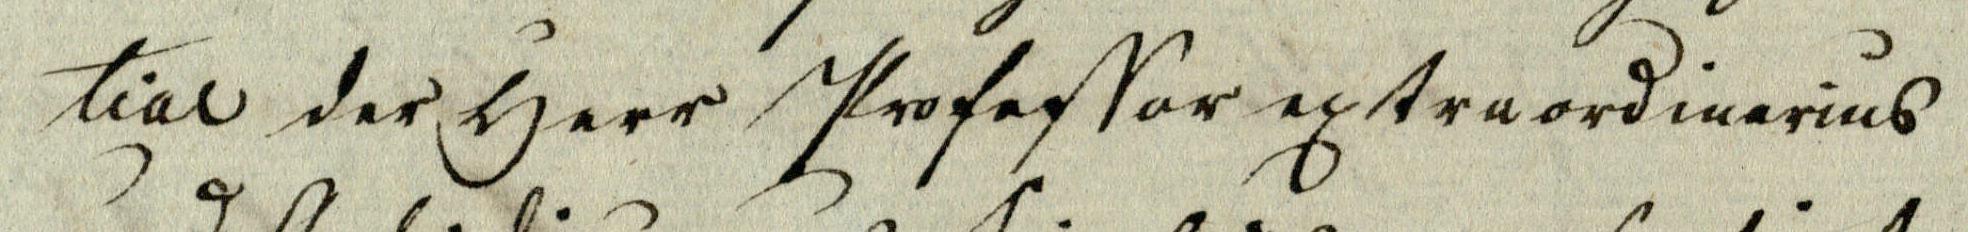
tiae der Herr Professor extraordinarius
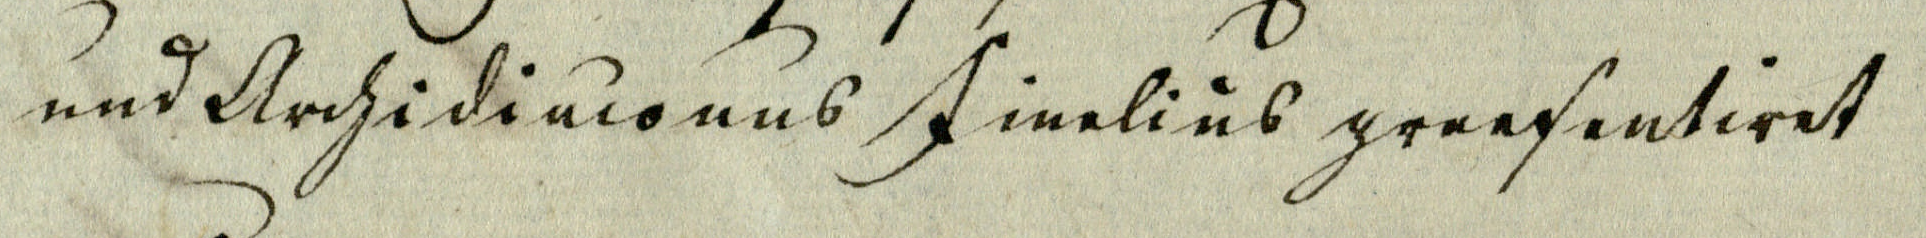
und Archidiaconus Finelius praesentiret
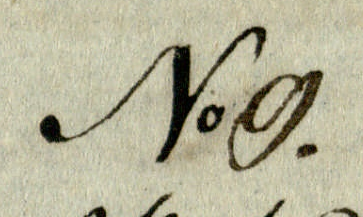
No 9.
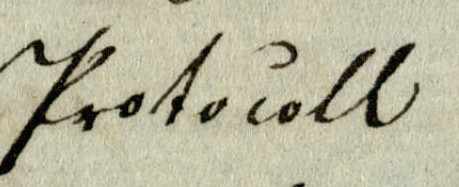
Protocoll
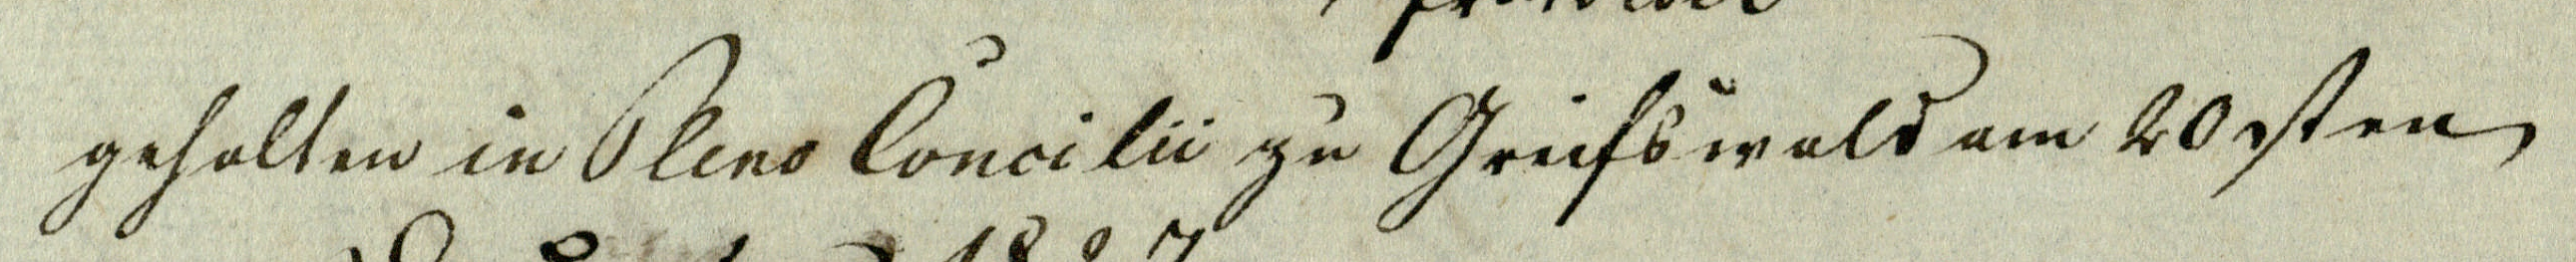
gehalten in Pleno Concilii zu Greifswald am 20 sten,
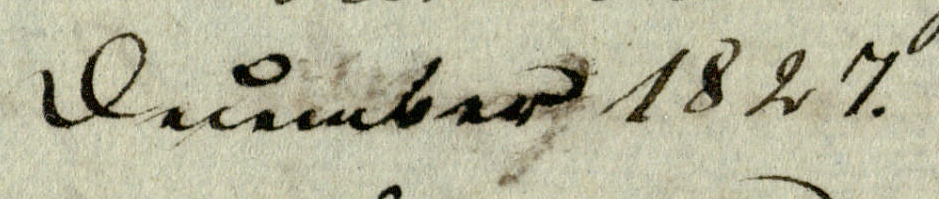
December 1827.
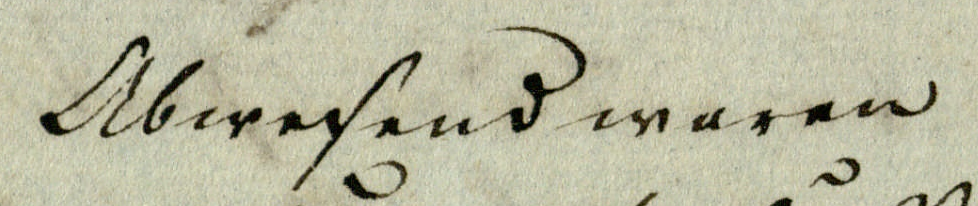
Abwesend waren
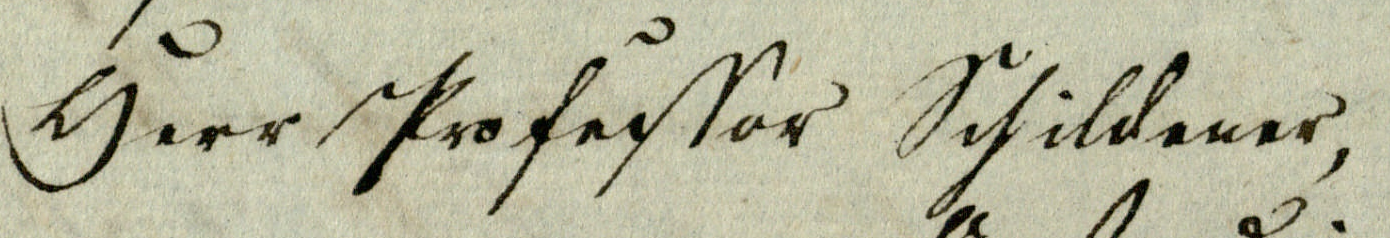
Herr Professor Schildener,
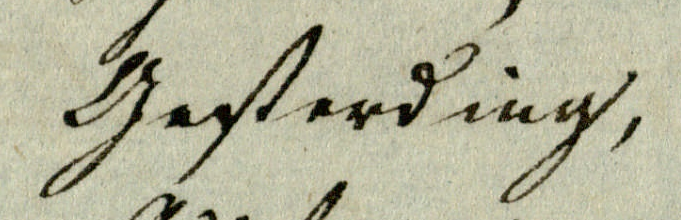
Gesterding,
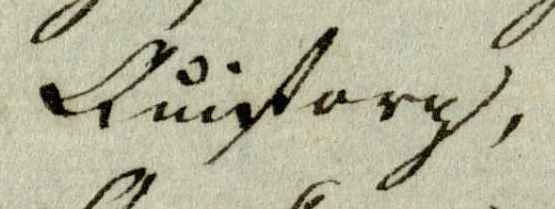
Quistorp,
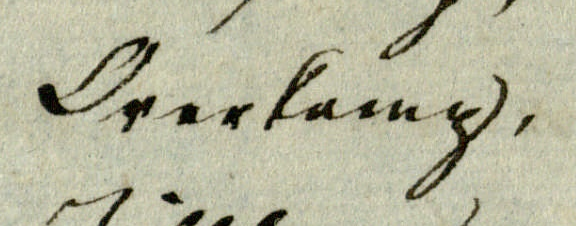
Overkamp,
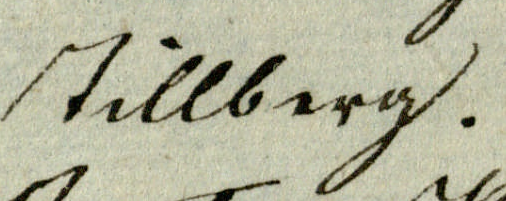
Tillberg.
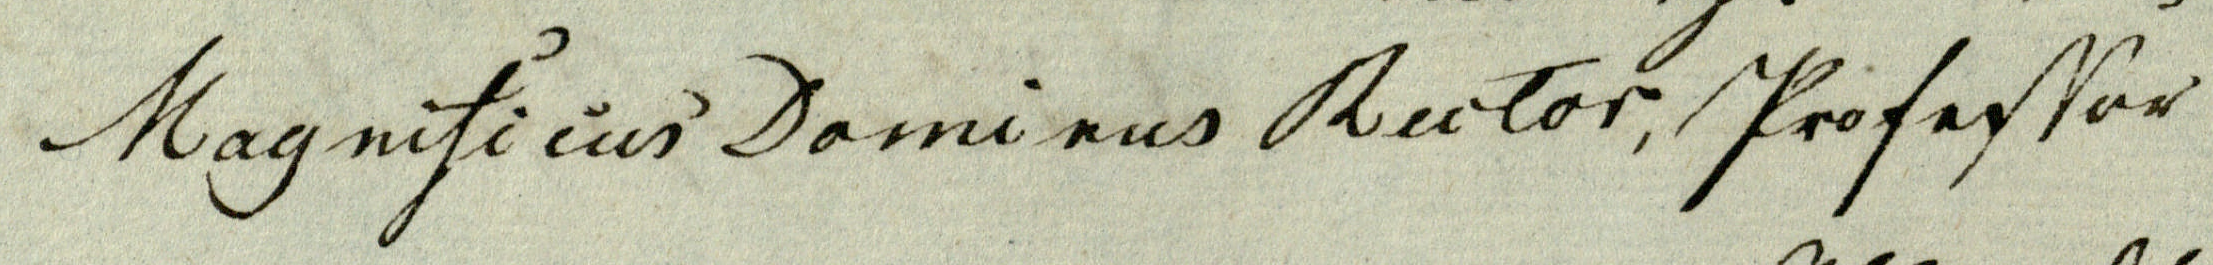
Magnificus Dominus Rector, Professor
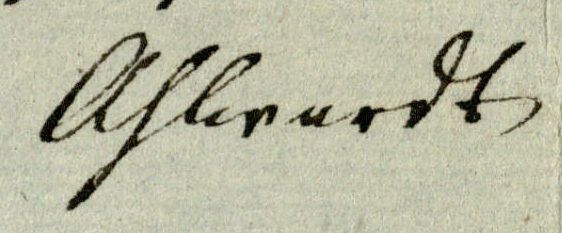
Ahlwardt
